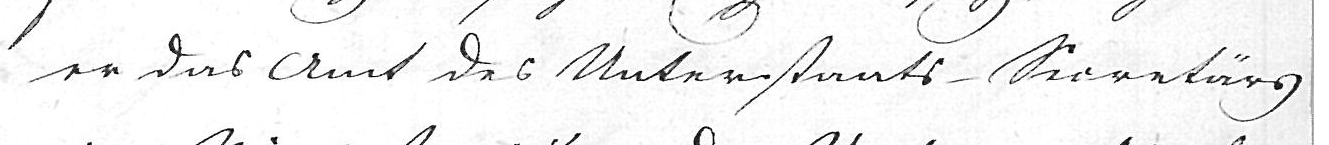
er das Amt der Unterstaats-Secretärs
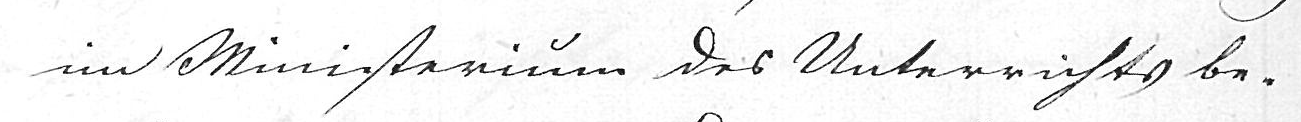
im Ministerium des Unterrichts be-
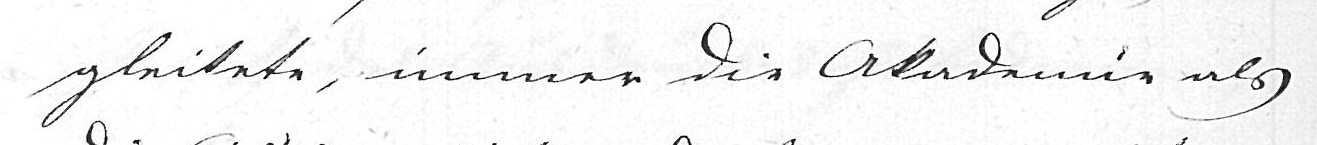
gleitete, immer die Akademie als
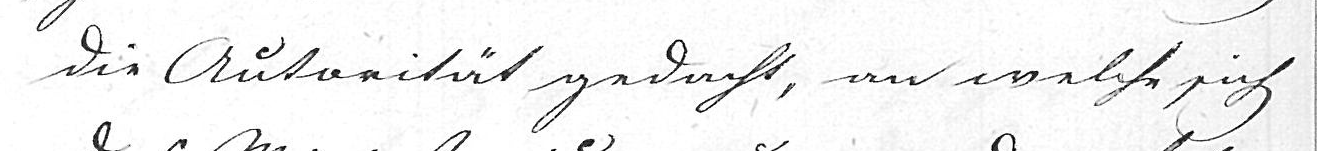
die Autorität gedacht, an welche auf
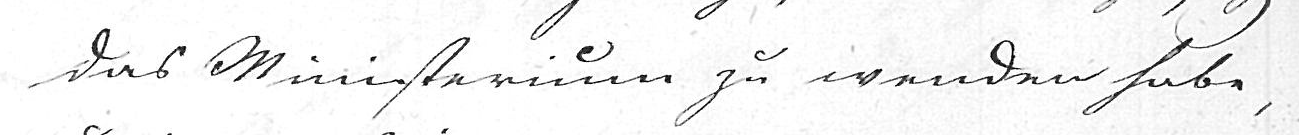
das Ministerium zu wenden habe,
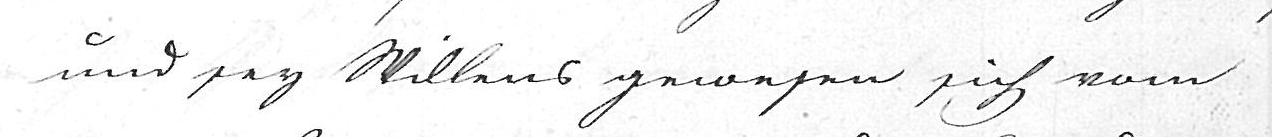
und sey Willens gewesen sich vom
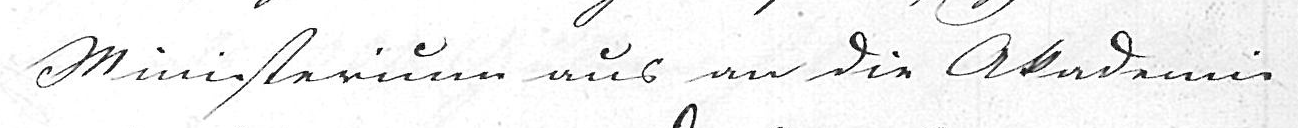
Ministerium aus an die Akademie
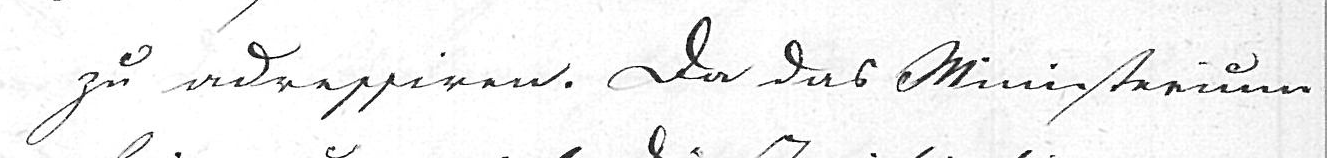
zu adressiren. Da das Ministerium
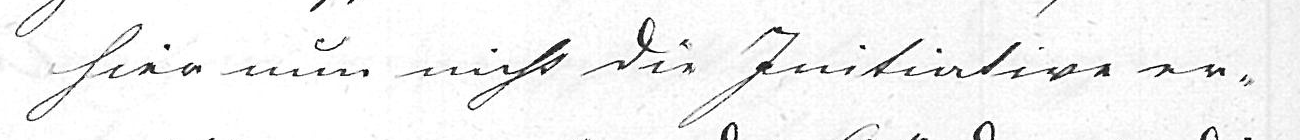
hier nun nicht die Initiative er-
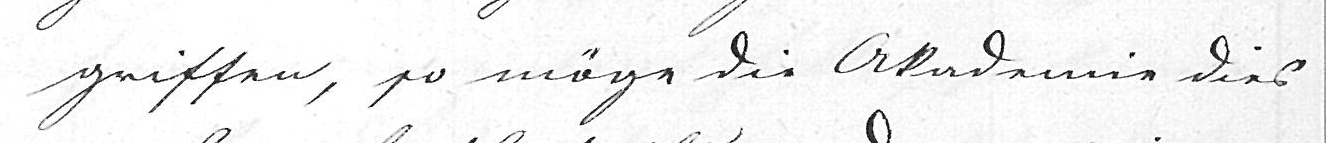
giffen, so möge die Akademie dies
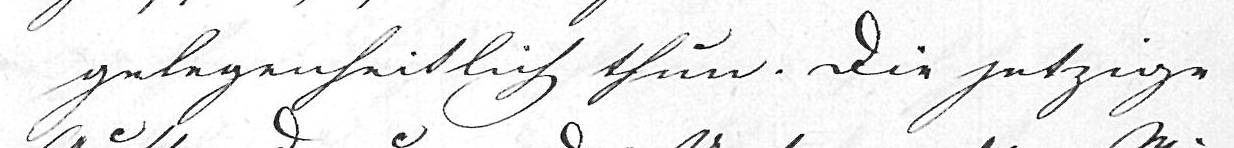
gelegenheitlich thun. Die jetzige
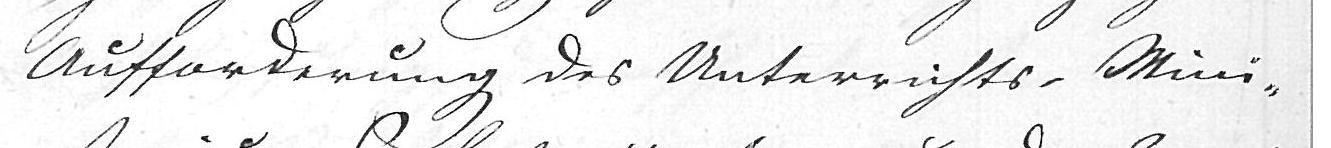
Aufforderung des Unterrichts-Mini-
